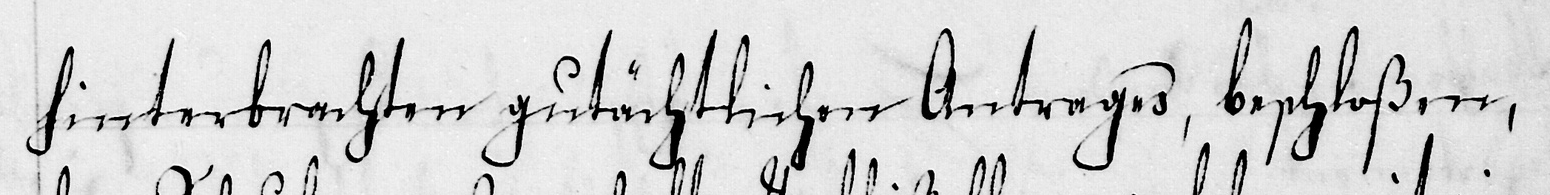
hinterbrachten gutächtlichen Antrages, beschloßen,
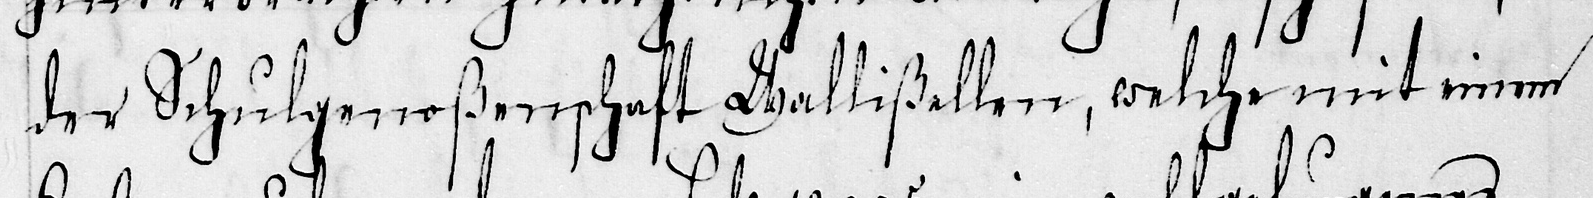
der Schulgenoßenschaft Wallißellen, welche mit einem
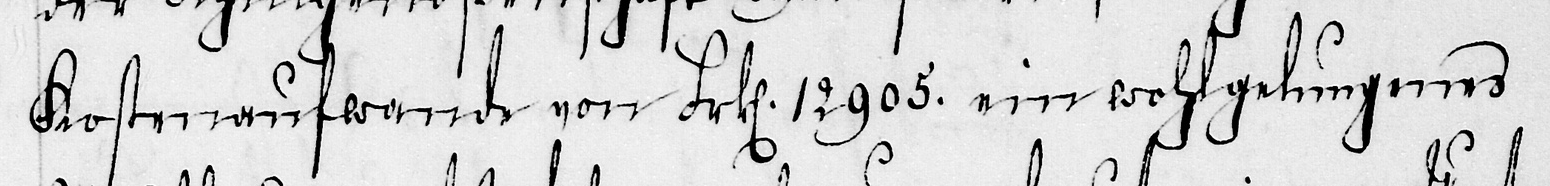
Kostenaufwande von Frk[en]. 12 905. ein wohlgelungenes
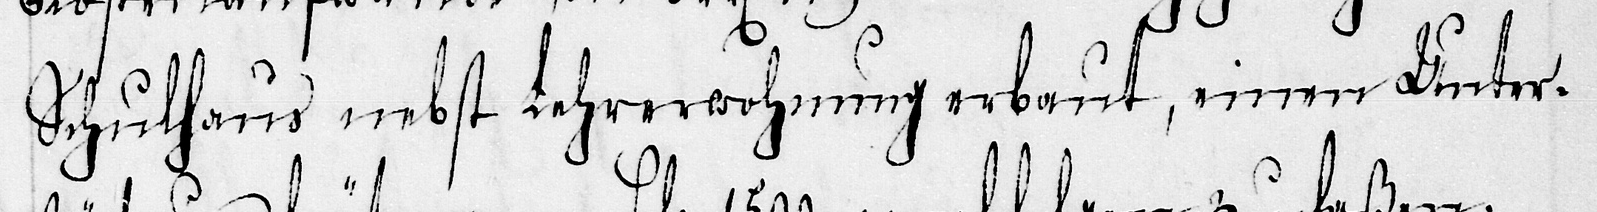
Schulhaus nebst Lehrerwohnung erbaut, einen Unter¬
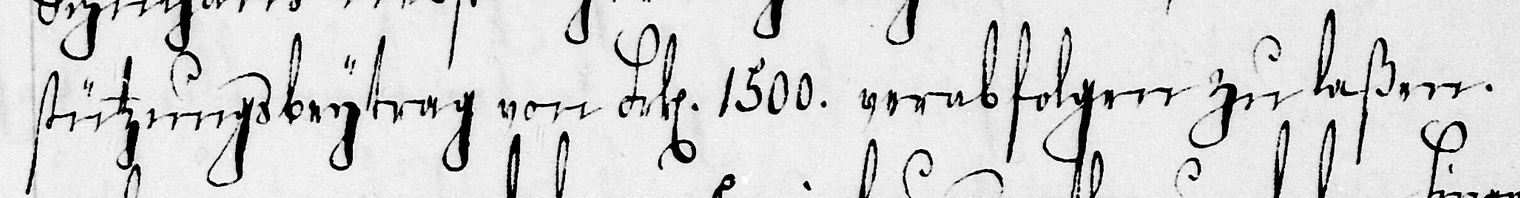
stützungsbeytrag von Frk[en]. 1500. verabfolgen zu laßen.
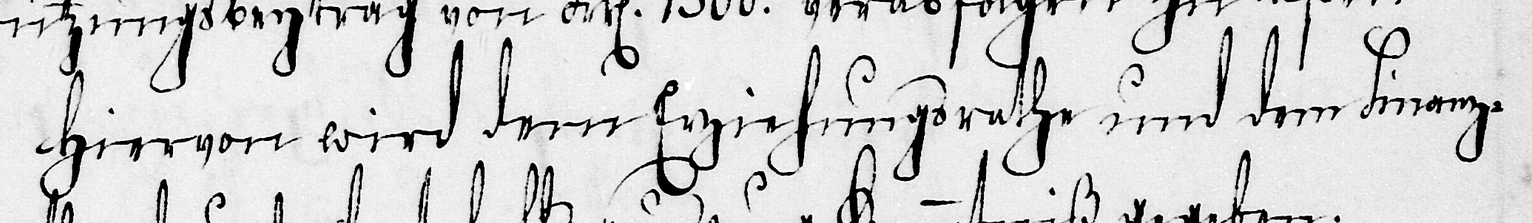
Hiervon wird dem Erziehungsrathe und dem Finanz¬
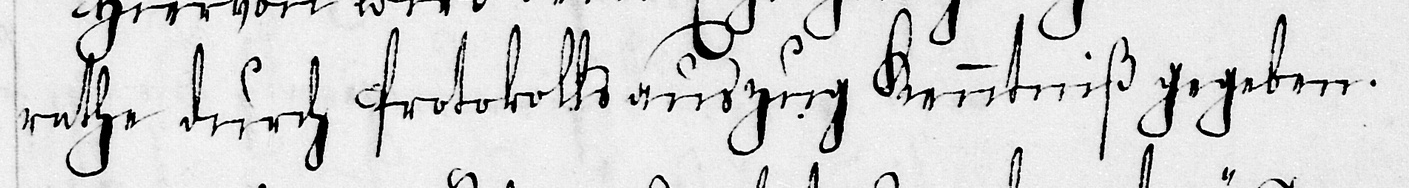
rathe durch Protokollsauszug Kenntniß gegeben.
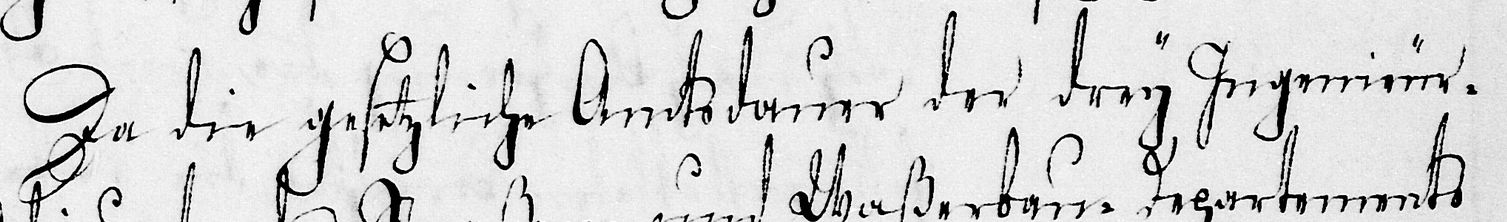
Da die gesetzliche Amtsdauer der drey Ingenieu¬
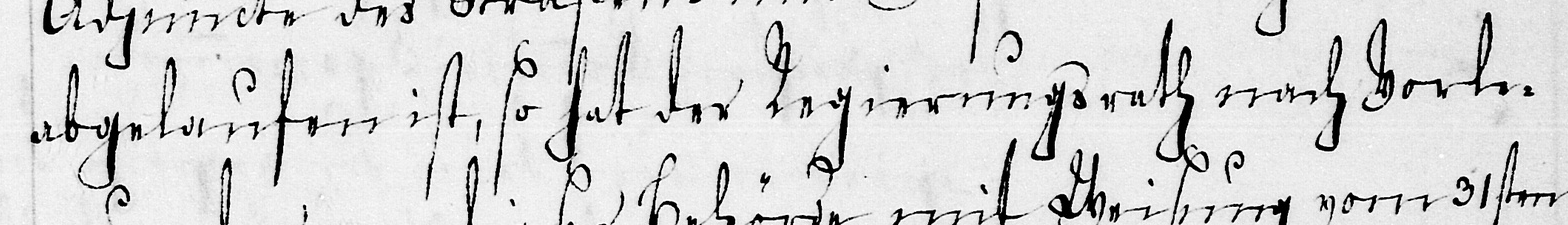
abgelaufen ist, so hat der Regierungsrath nach Vorle¬
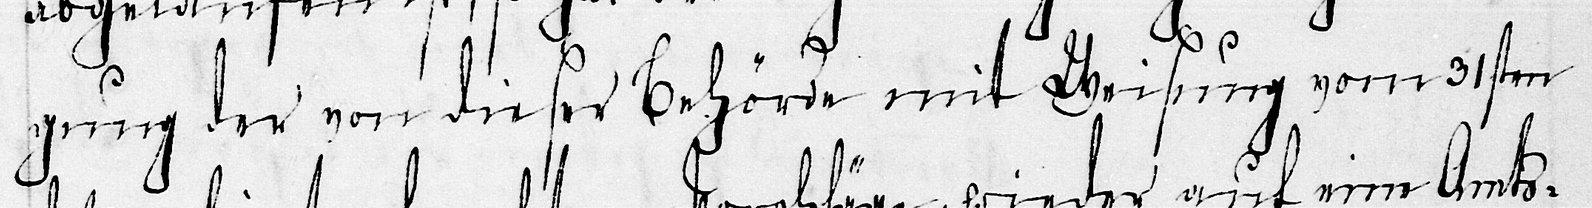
gung der von dieser Behörde mit Weisung vom 31sten
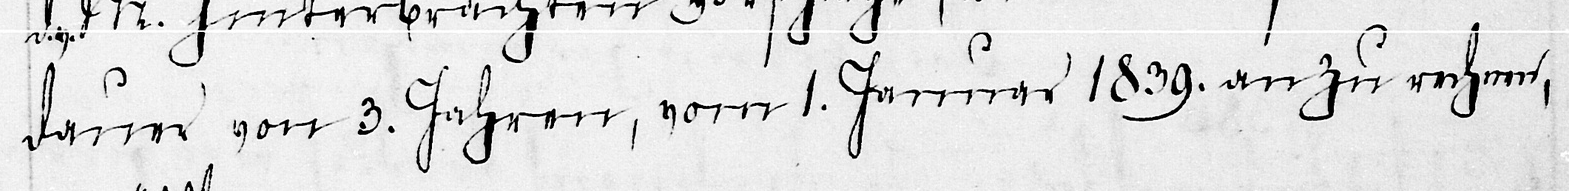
dauer von 3. Jahren, vom 1. Januar 1839. an zu rechnen,
